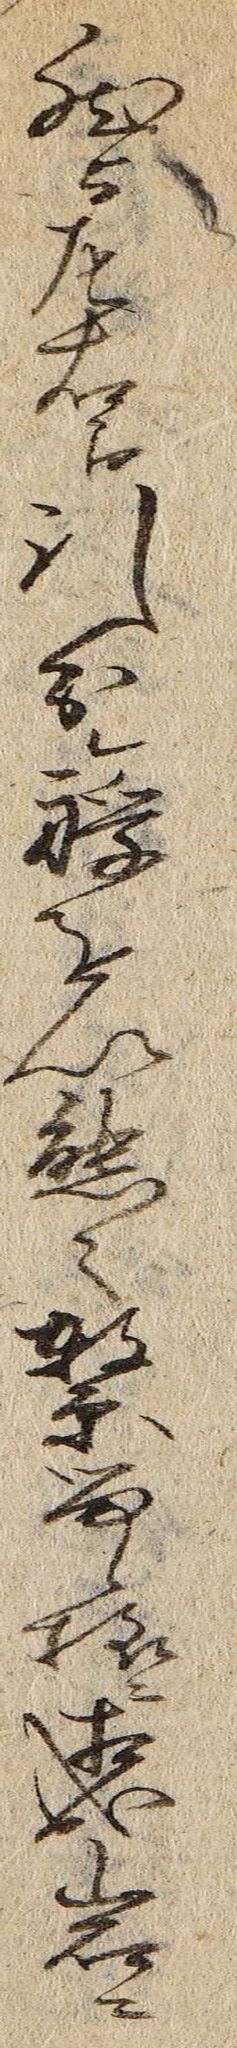然と左右へ引分レ艀を以て態々繋留候様に相成岩に
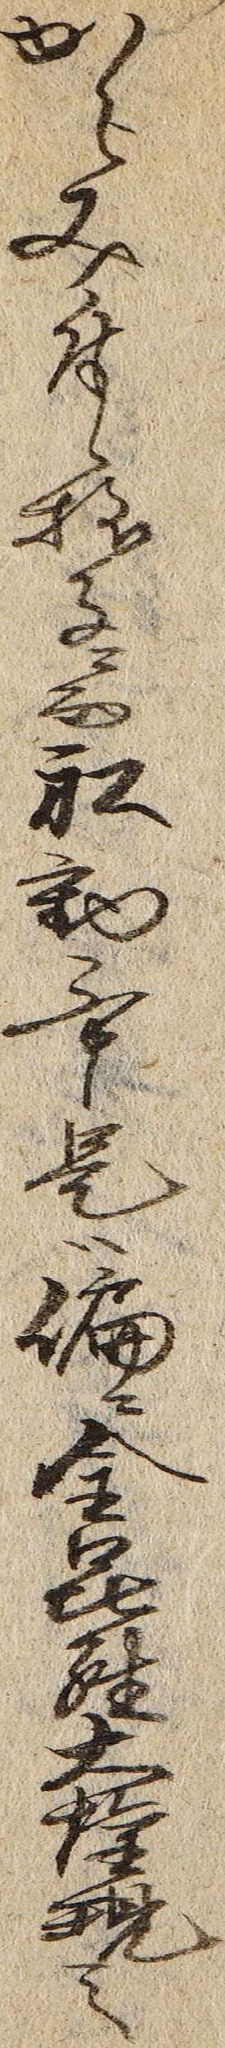からみ付候様子にて船動不申是は偏に金毘羅大権現の
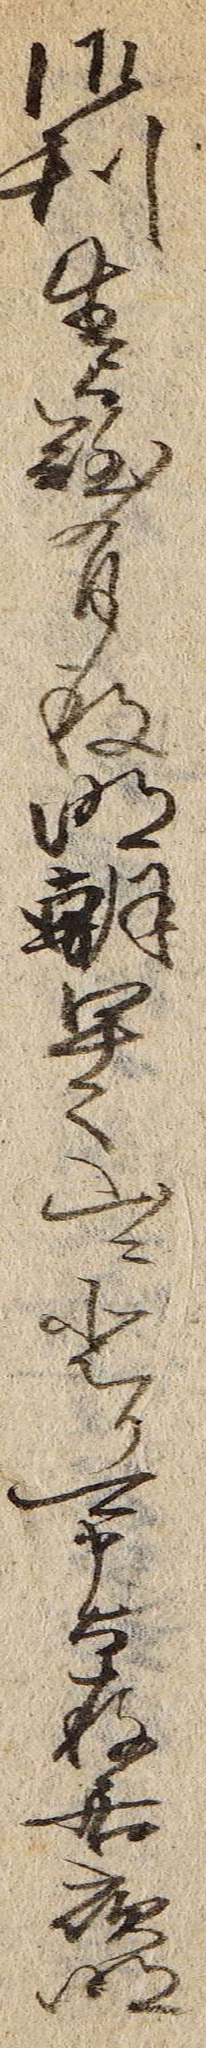御利生と難有存明朝早々山に登り可申と存居夜明
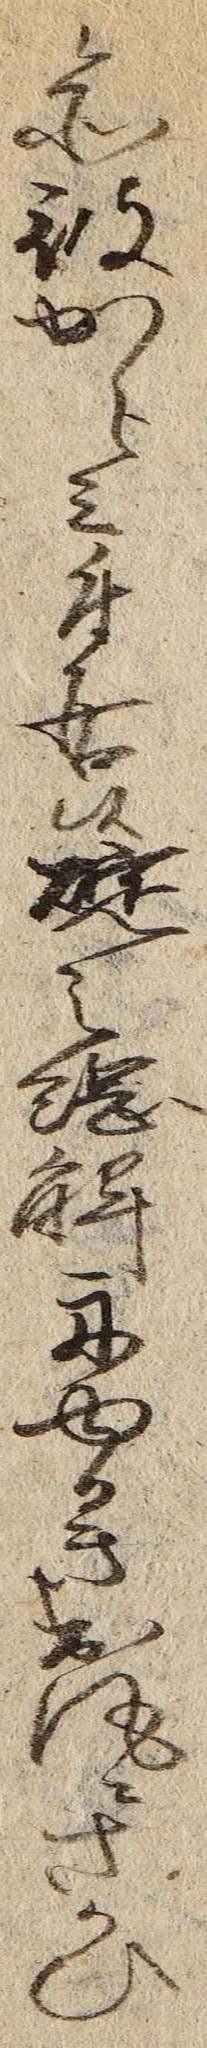候所彼からみ付居候碇の綱解舟ゆるき出風にさかひ
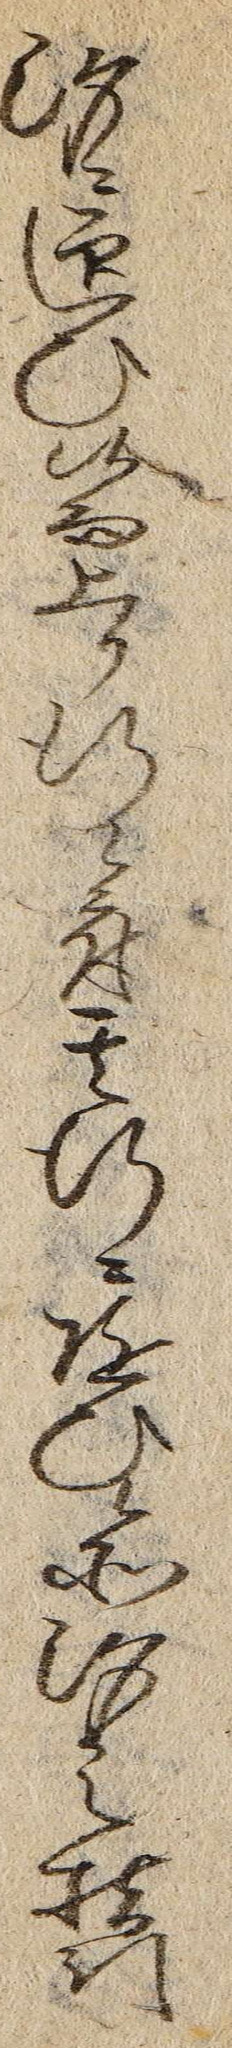汐に迎ひ候て上り行候に付其行に随ひ候所汐の指引
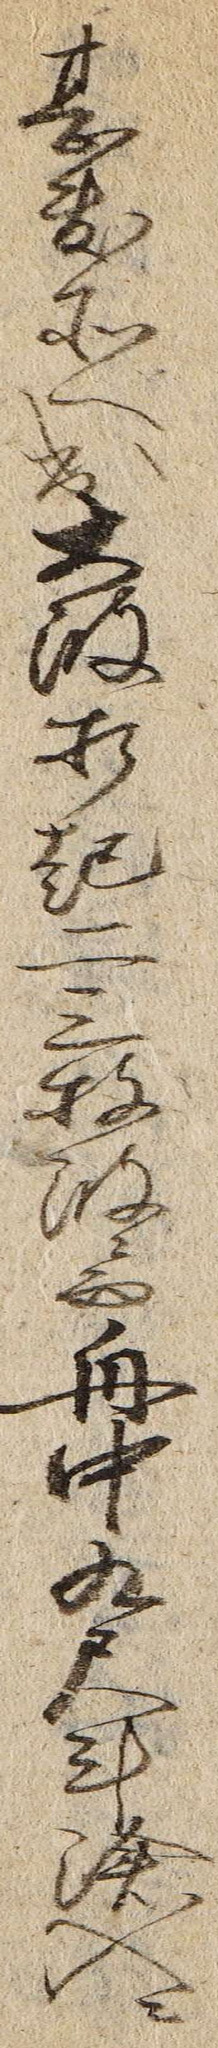甚しき所へ出大波打起二三枚波にて舟中九尺斗滄入に
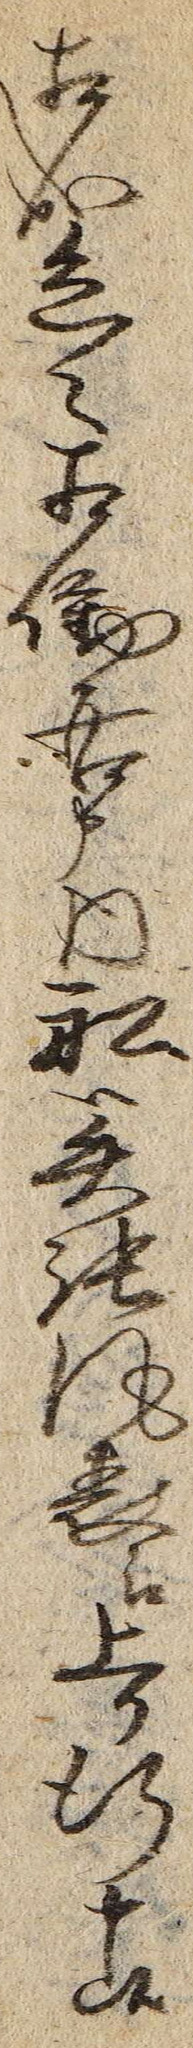相成色々相働居申内船は矢張風表へ上り行申候
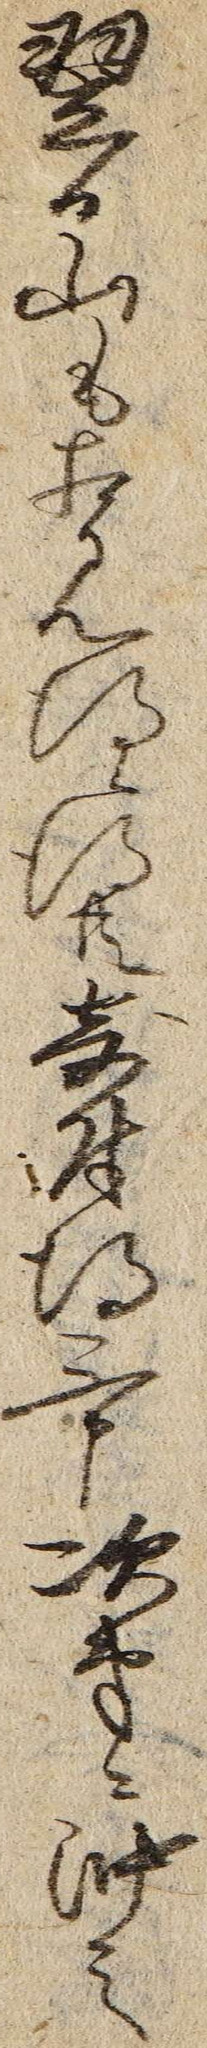翌日山も相見え候得ども寄付得不申次第に沖の
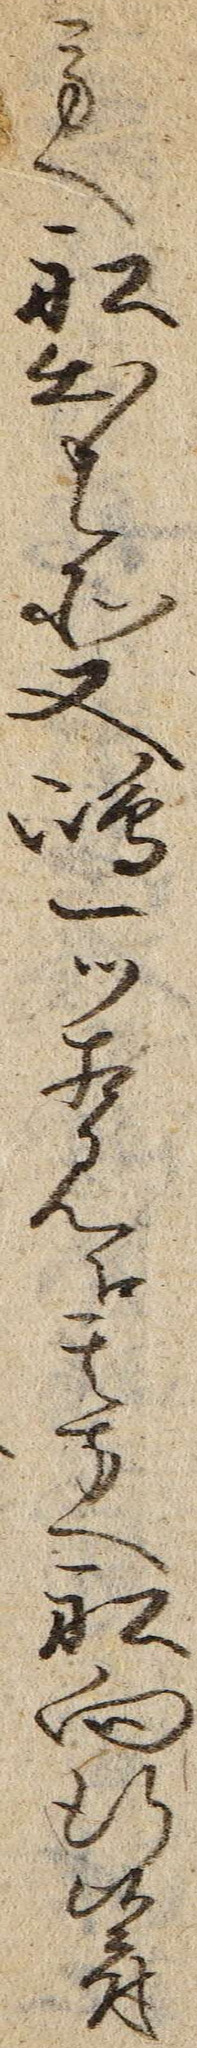方へ舟出申候所又島一つ相見え其方へ船向行候に付
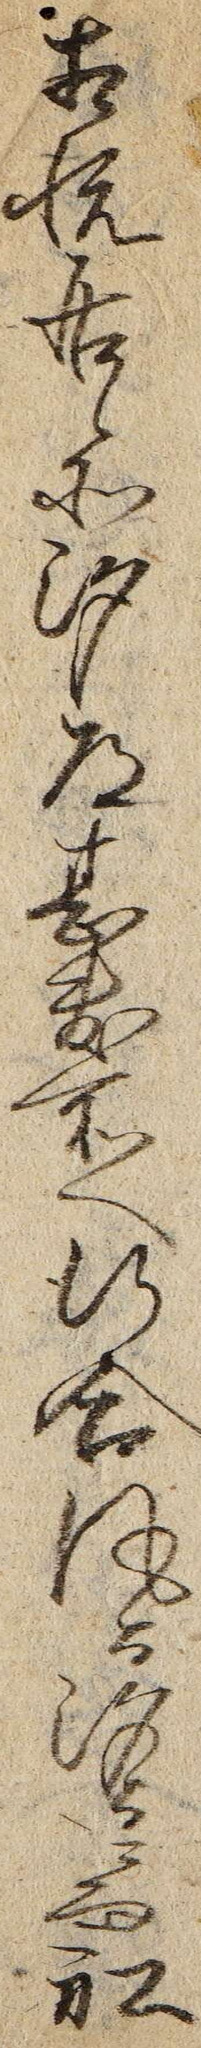相悦居候所汐道甚しき所へ行合風と汐とにて船。

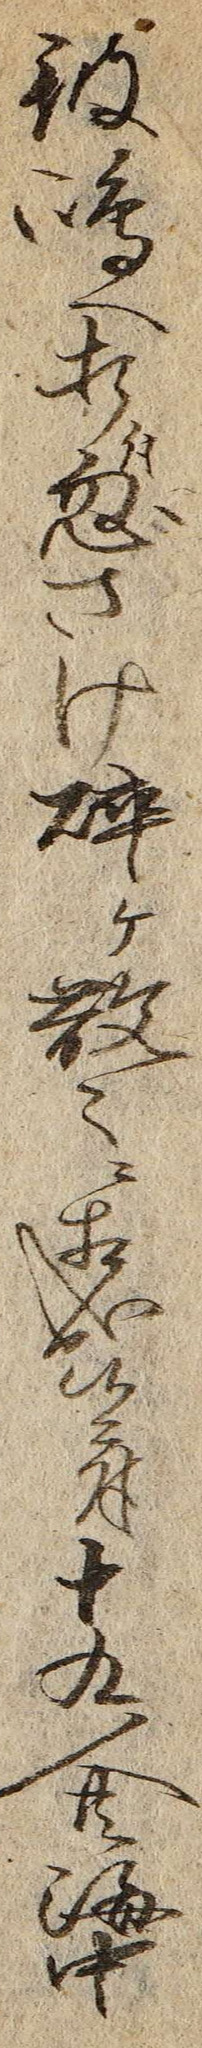被島へ打付忽さけ砕け散々に相成候に付十九人とも海中
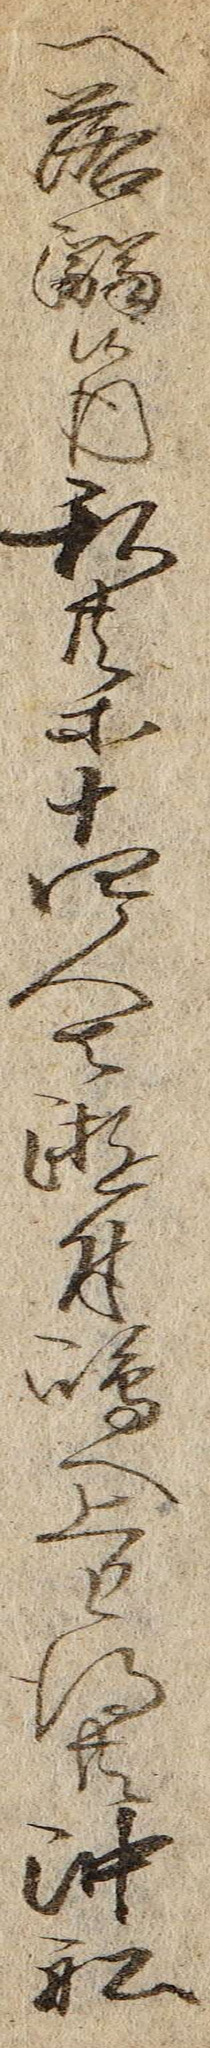へ落溺候内私ども等十四人は泳付島へ上り候得ども沖船
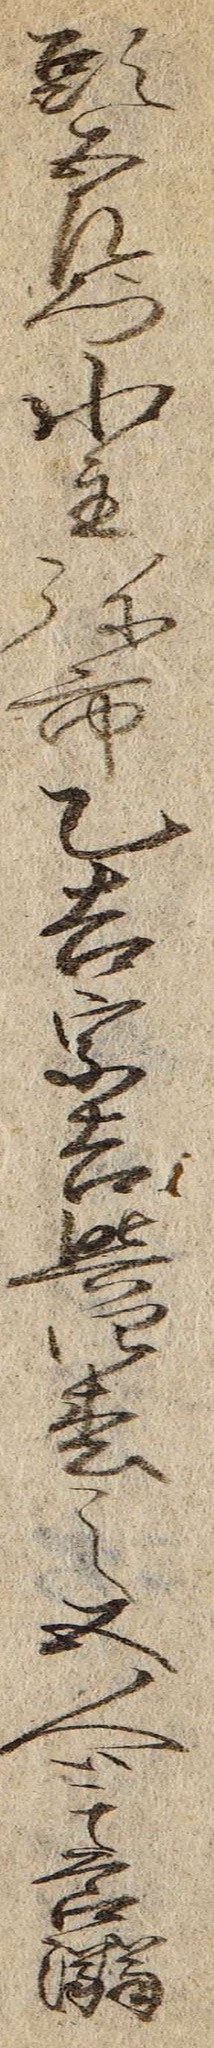頭五左衛門水主弥市乙吉宗吉与四松の五人は其節溺
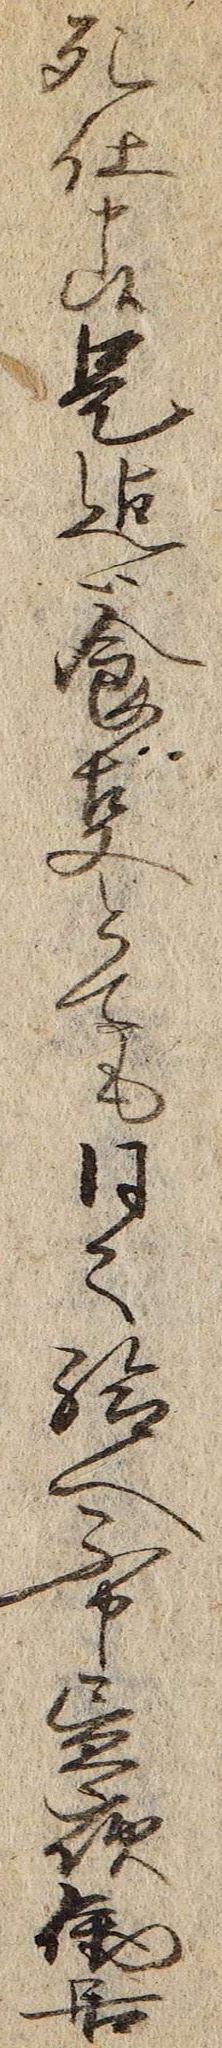死仕申候是までは食事とても日々給へ不申昼夜働居
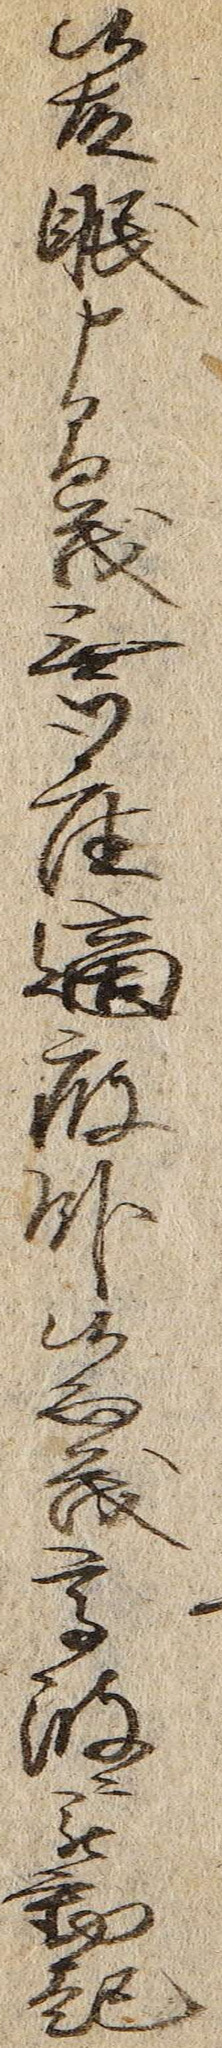候故眠申間も無御座適疲伏候ても高波に被動起
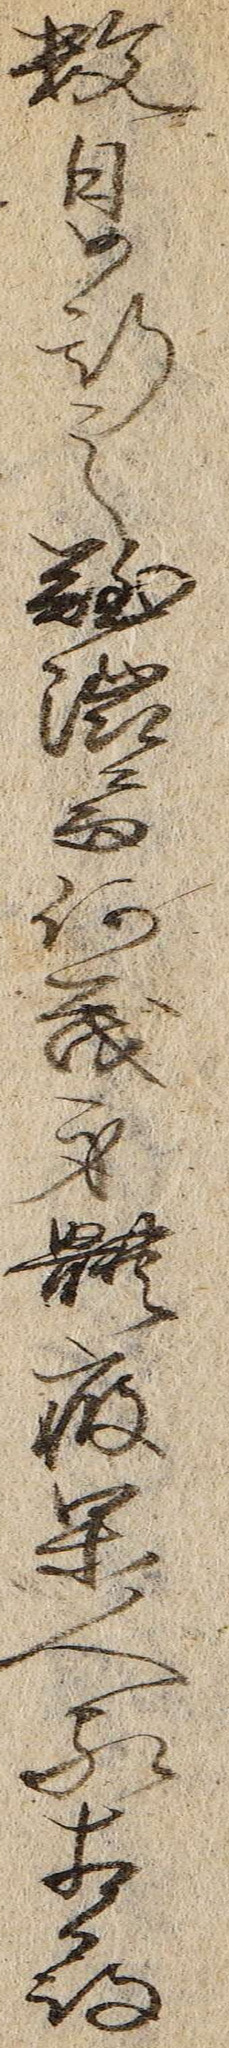数日如斯の難渋にて何も身体疲果人家相尋
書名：能登国清兵衛異国江漂流之始末
